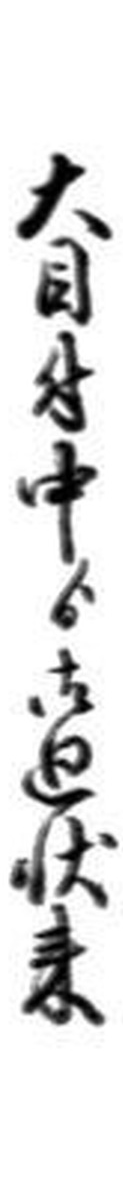大目付中ゟ御廻状来
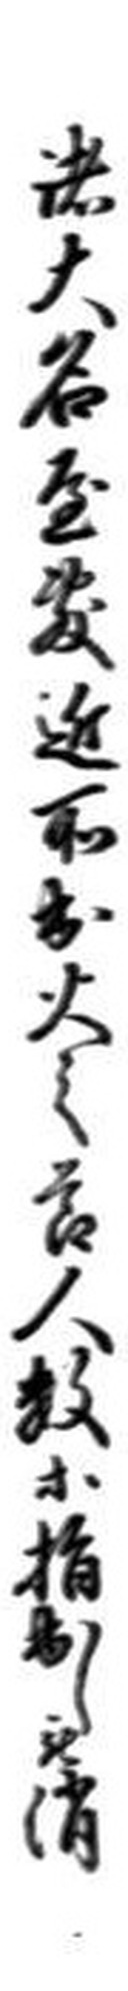諸大名屋敷近所出火之節人数指出し被消
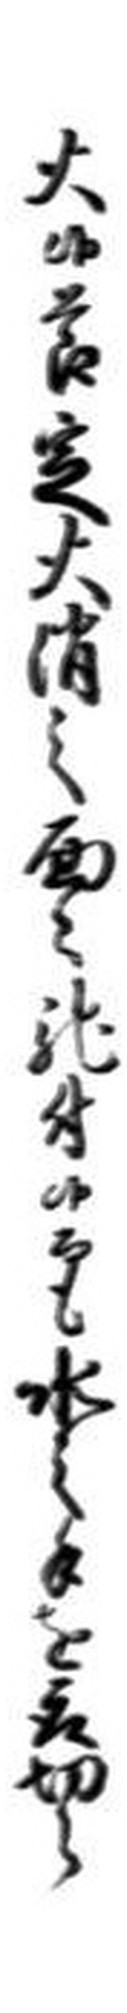火候節火消之面々馳付候而も水之手を取切ら
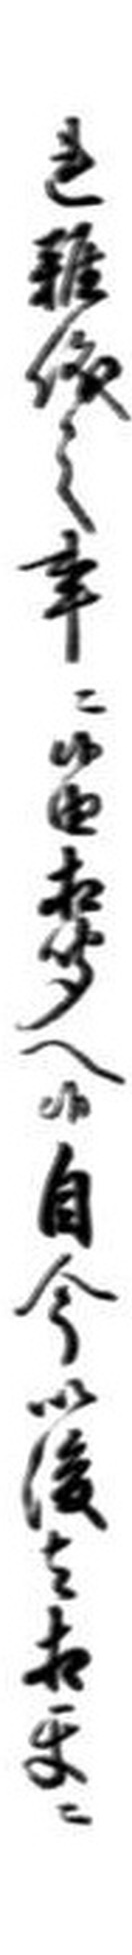れ難儀之事ニ候由相聞へ候自今以後者相互ニ
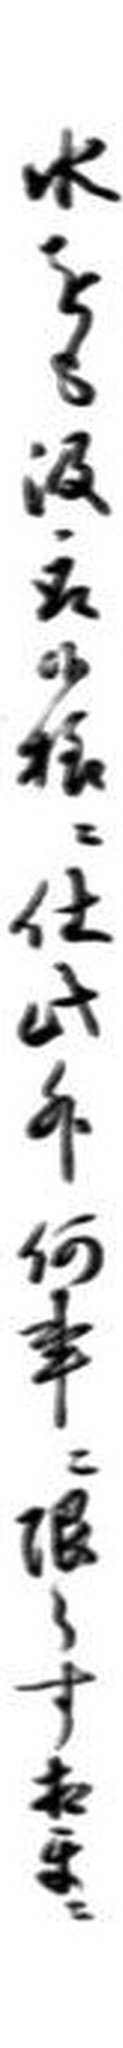水をも汲取候様ニ仕此外何事ニ限らす相互ニ

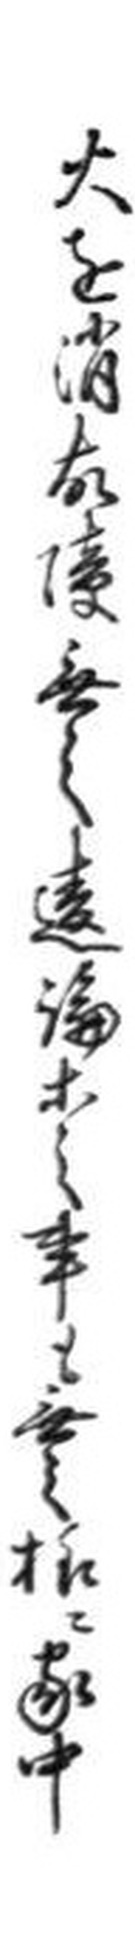火を消故障無之違論等之事も無之様ニ家中
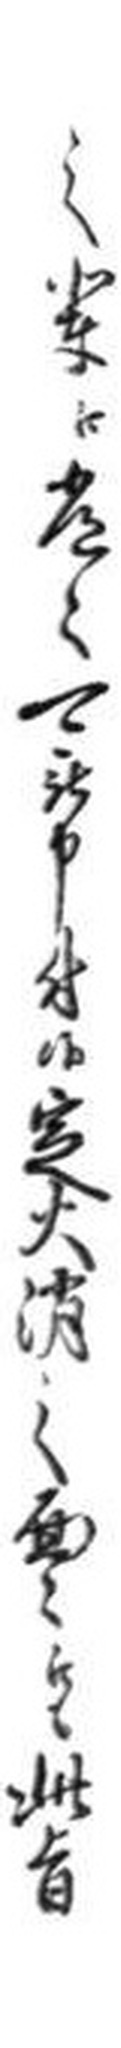之輩江常々可被申付候定火消之面々江も此旨
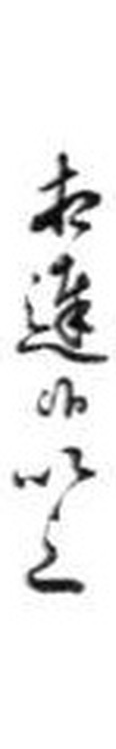相達候以上
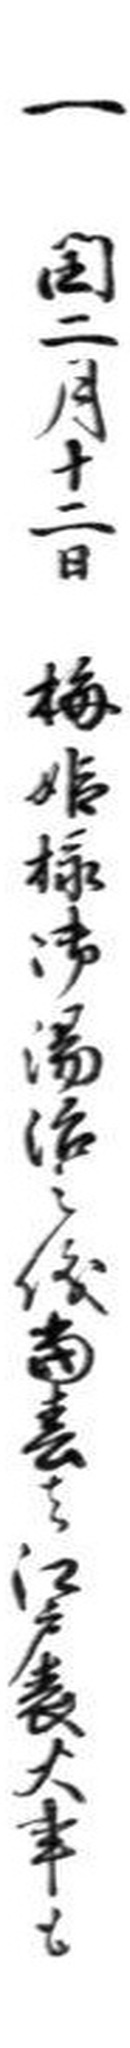一閏二月十二日梅姫様御湯治之儀当春者江戸表火事も
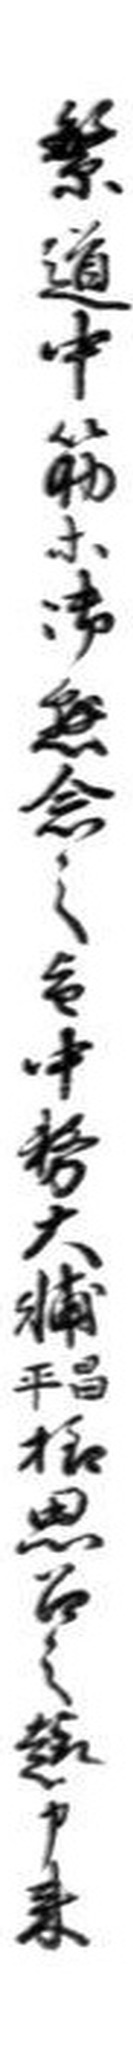繁道中筋等御懸念之旨中務大輔昌平様思召之趣申来
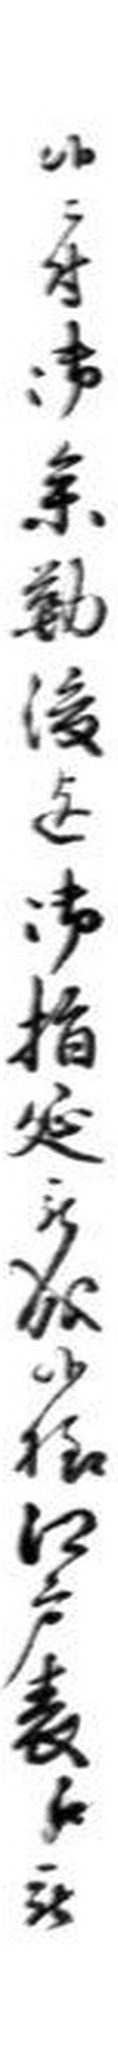候ニ付御参勤後迄御指延被成候様江戸表江被
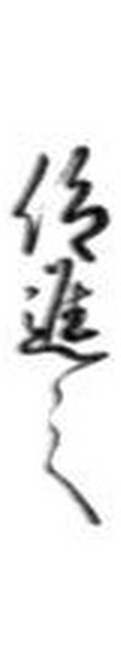仰進之
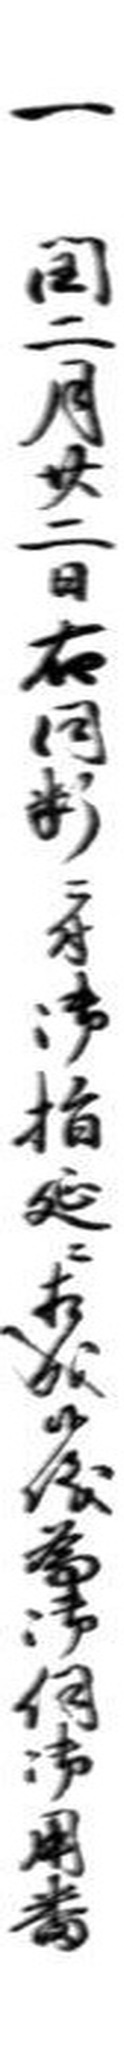一閏二月廿二日右同断ニ付御指延ニ相成候儀為御伺御用番
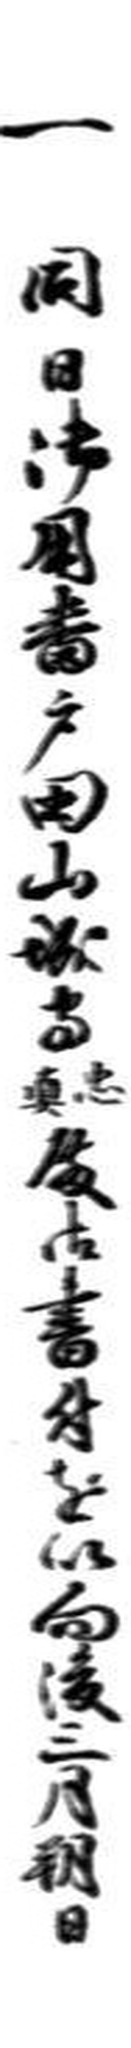一同日御用番戸田山城守忠真殿御書付を以向後三月朔日
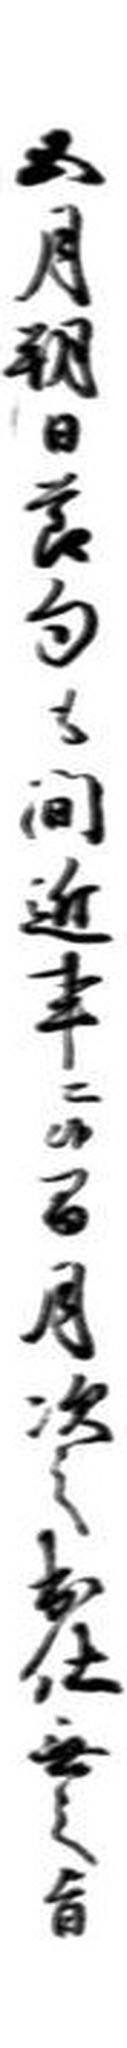五月朔日節句も間近事ニ候間月次之出仕無之旨
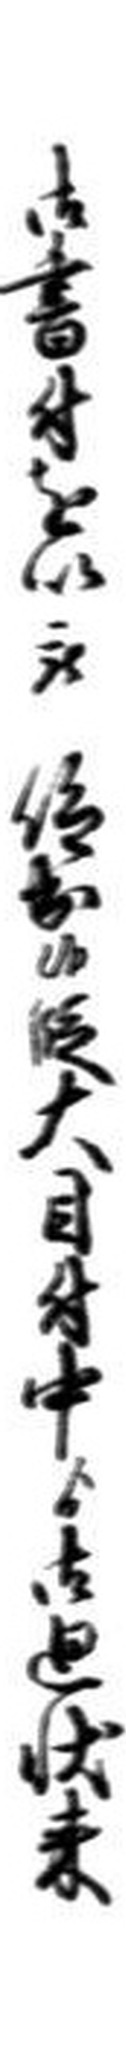御書付を以被仰出候段大目付中ゟ御廻状来
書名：家譜 三十一 吉邦公 享保元年
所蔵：福井県文書館 Fukui Prefectural Archives
